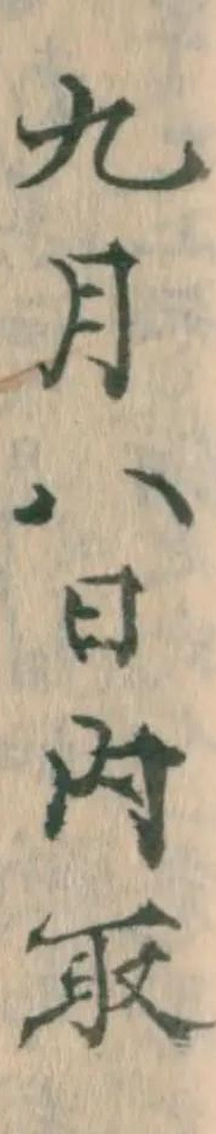九月八日内取
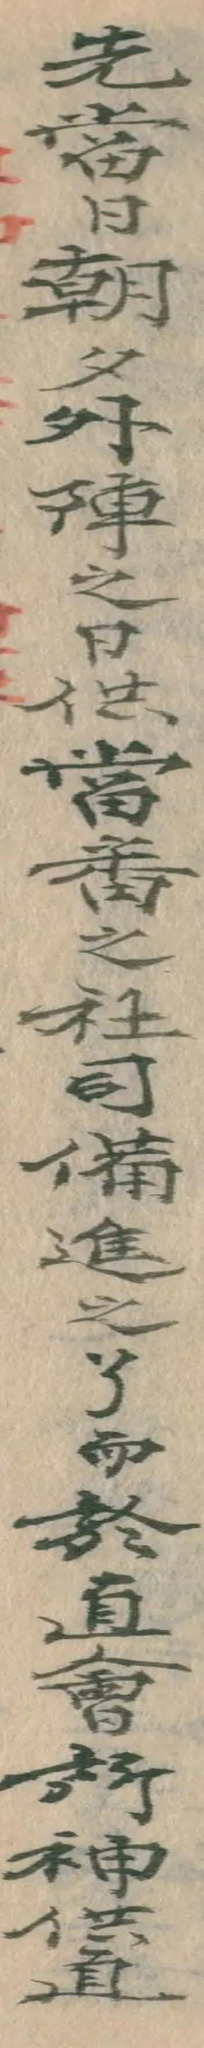先当日朝夕外陣之日供当番之社司備進之了而於直会所神供直

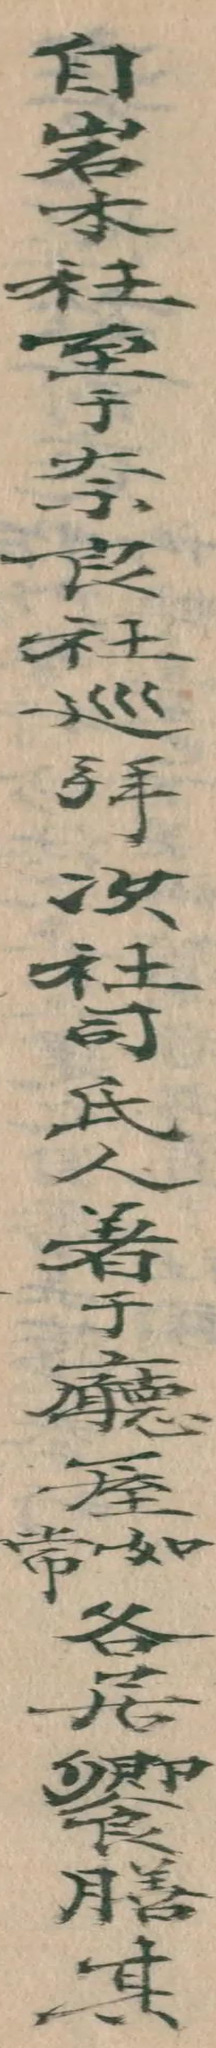自岩本社至于奈良社巡拝次社司氏人着于庁屋如常各居饗膳其
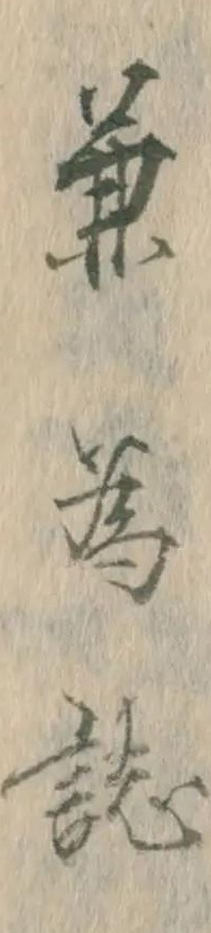兼為誌

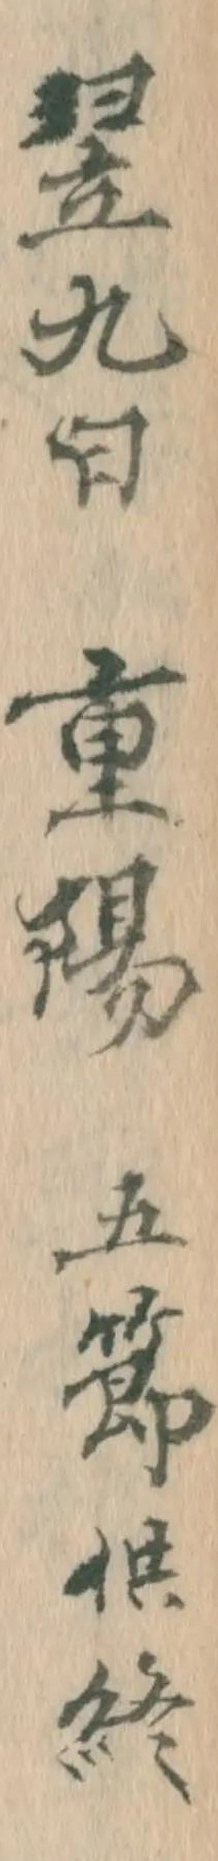翌九日重陽五節供終

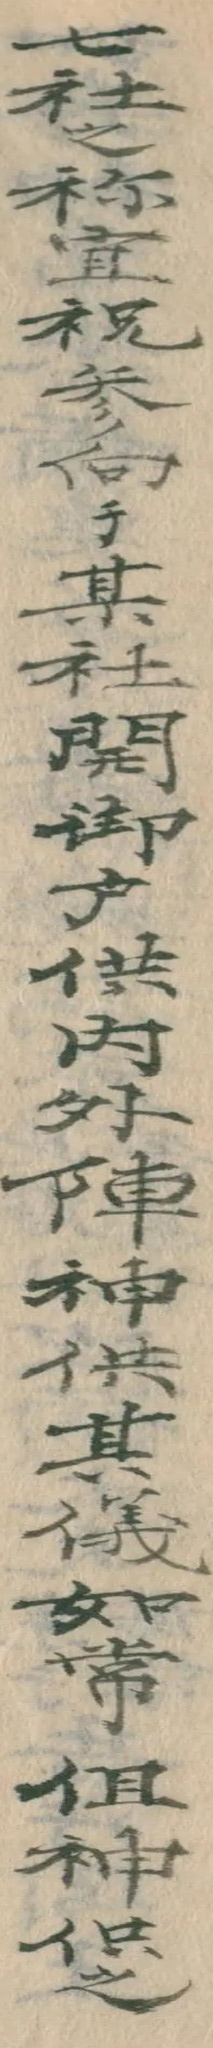七社之祢宜祝参向于某社開御戸供内外陣神供其儀如常但神供之

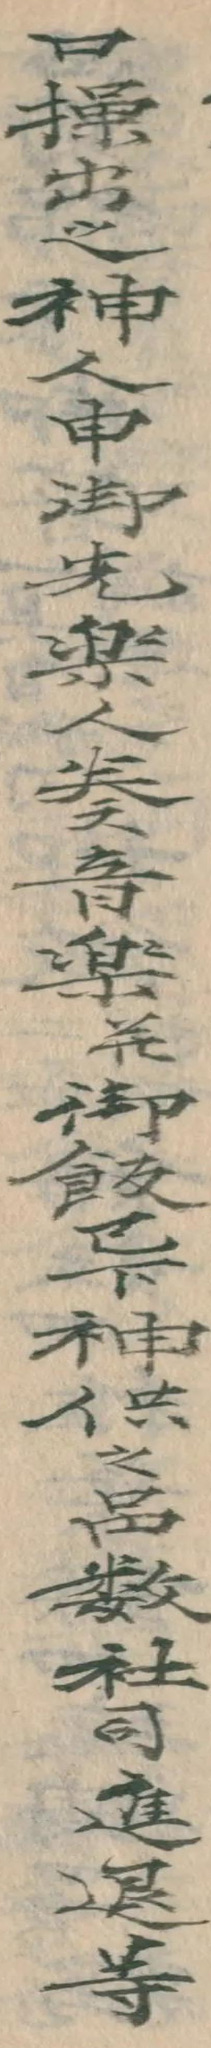口操出之神人申御先楽人奏音楽并御飯已下神供之品数社司進退等

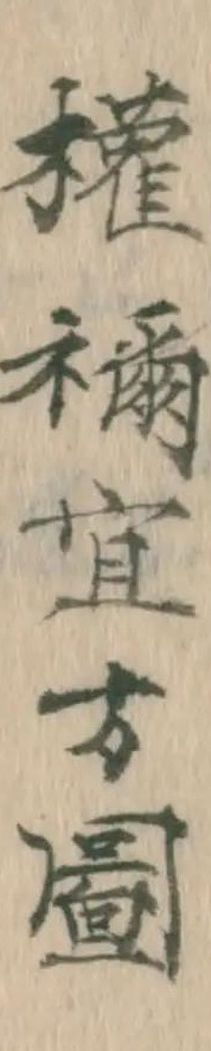権祢宜方図

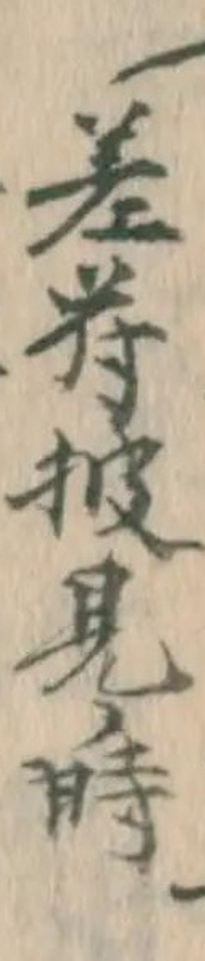差符披見ノ時
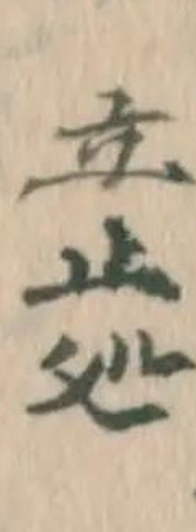立止処
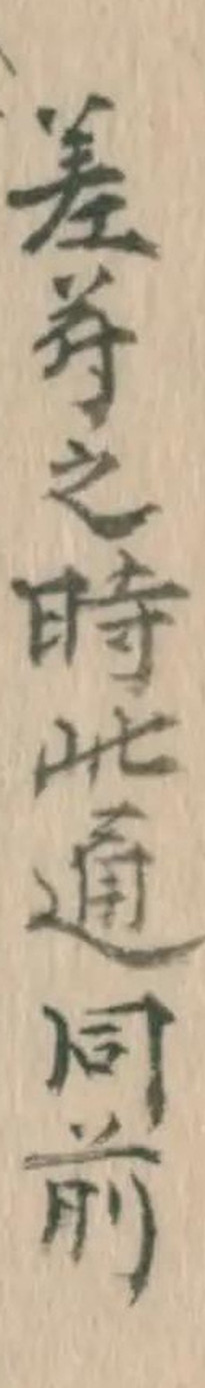差符之時此通同前
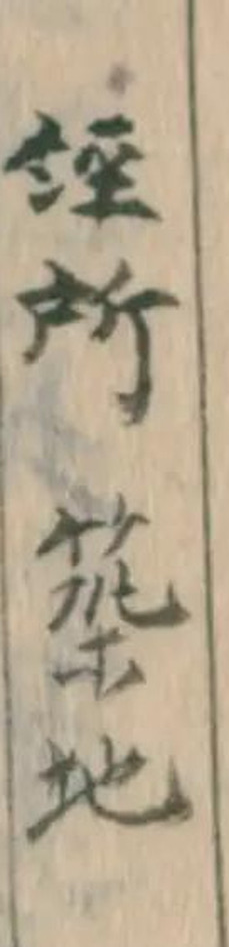経所築地
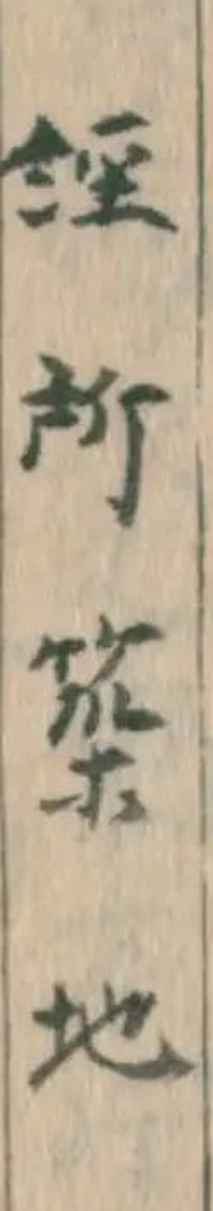経所築地
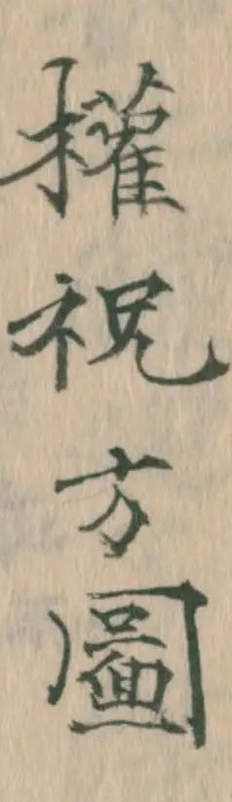権祝方図
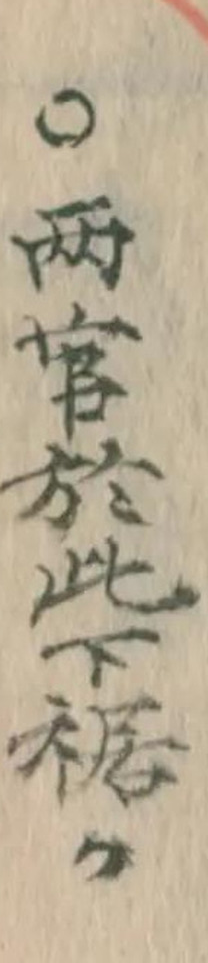◦両官於此下裾カ

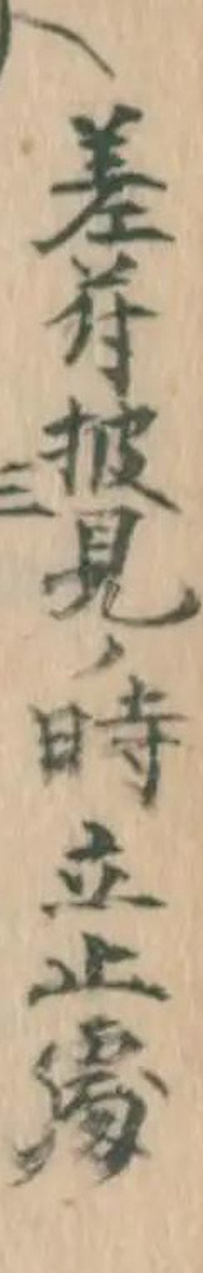差符披見ノ時立止処
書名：賀茂社記録. 第9冊
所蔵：国立国会図書館 National Diet Library, JAPAN
